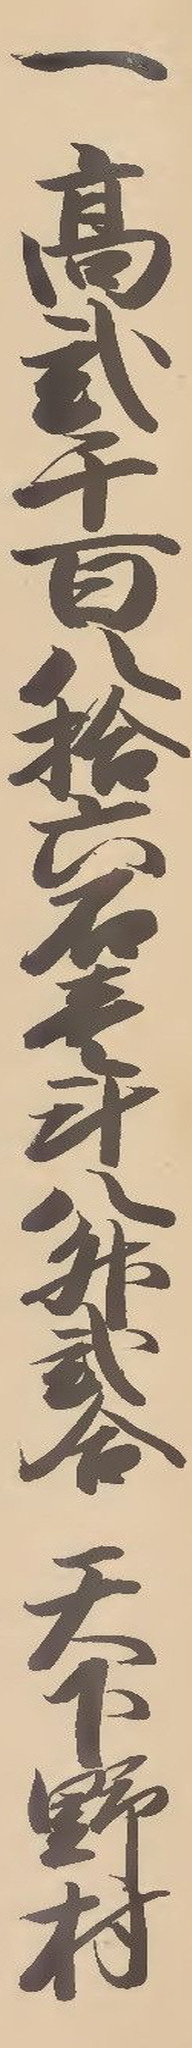一高弐千百八拾六石壱斗八升弐合天下野村
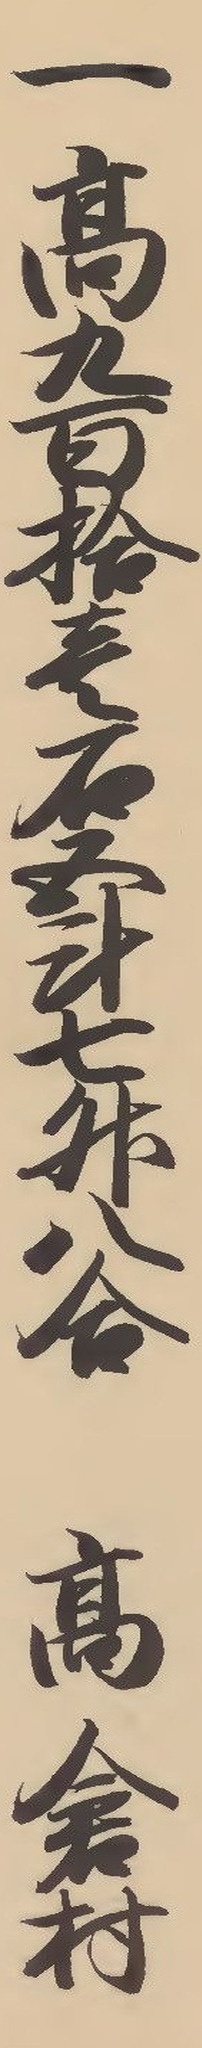一高九百拾壱石五斗七升八合高倉村
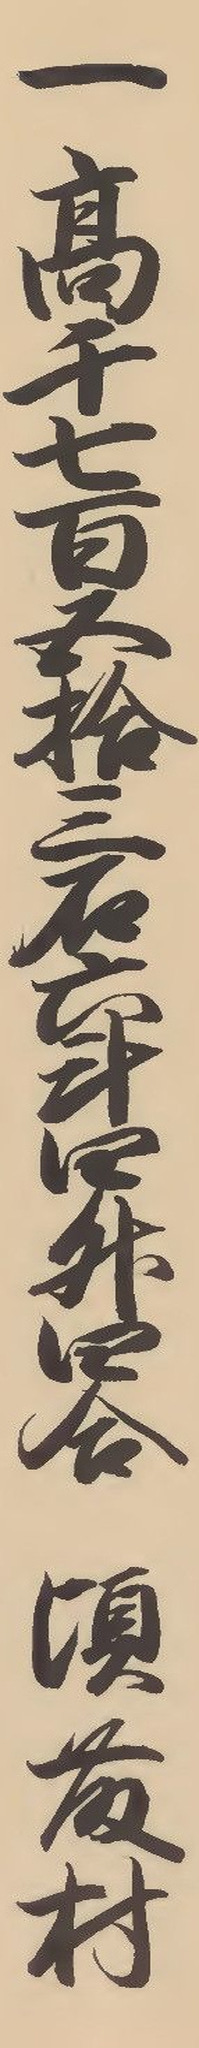一高千七百五拾三石六斗四升四合頃藤村
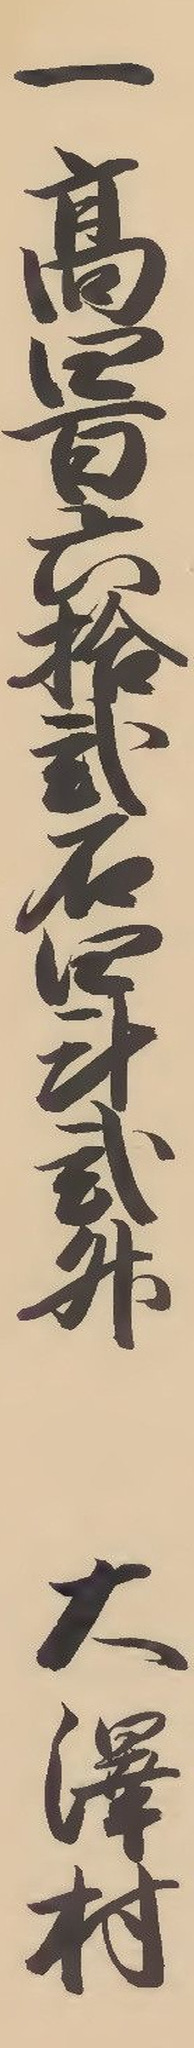一高四百六拾弐石四斗弐升大沢村

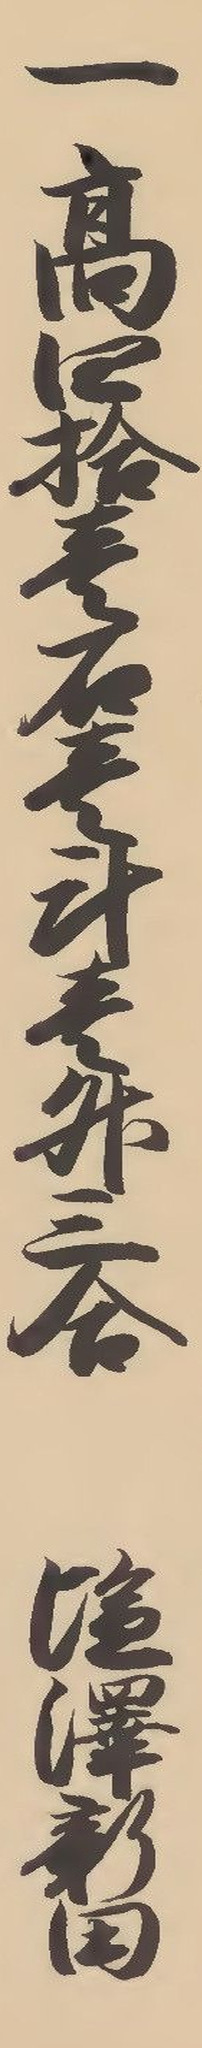一高四拾壱石壱斗壱升三合塩沢新田
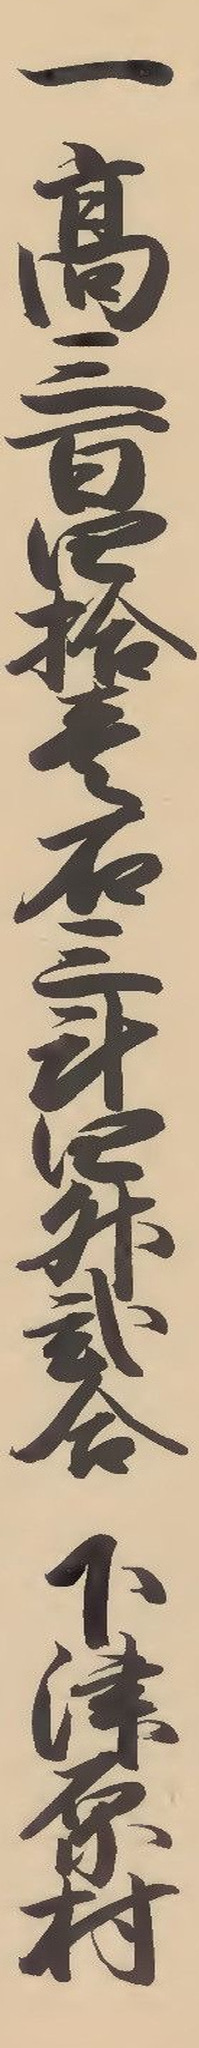一高三百四拾壱石三斗四升弐合下津原村
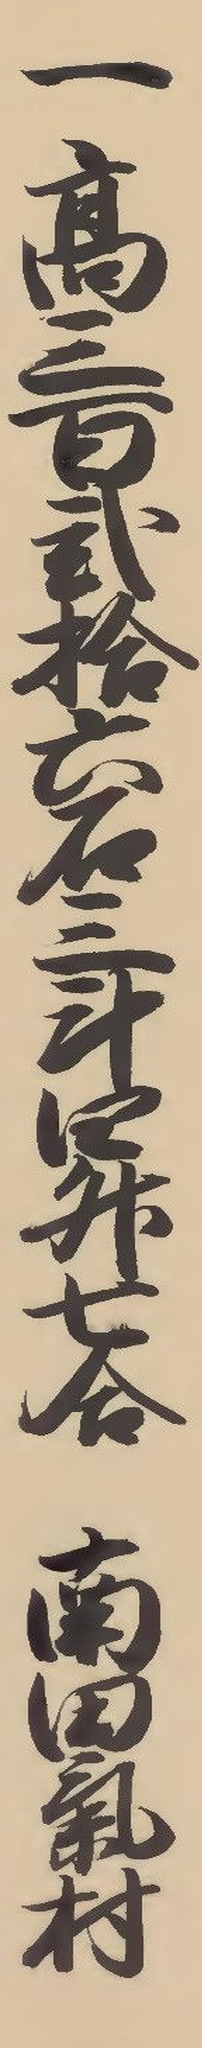一高三百弐拾六石三斗四升七合南田気村
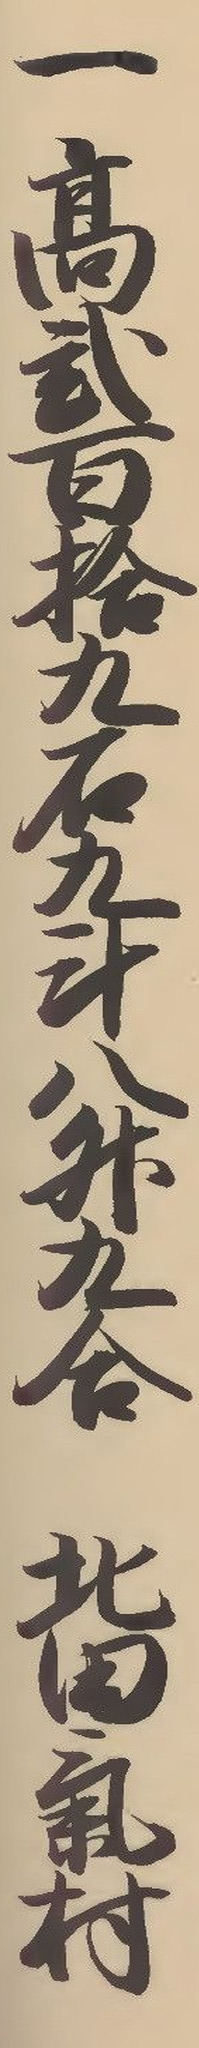一高弐百拾九石九斗八升九合北田気村
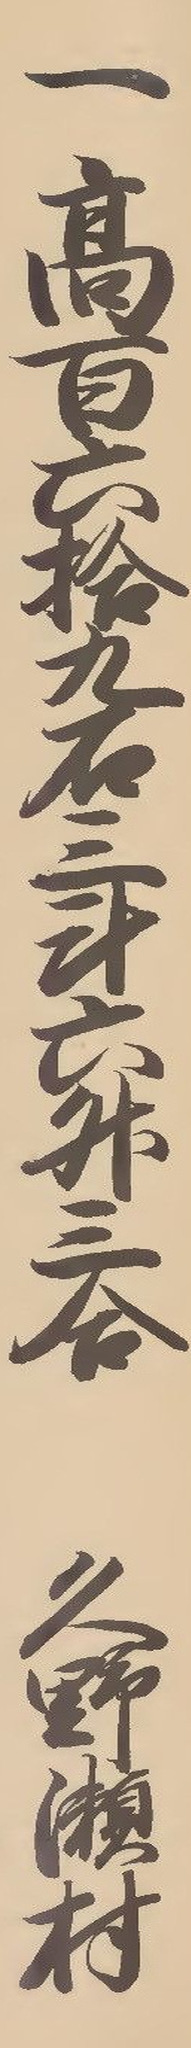一高百六拾九石三斗六升三合久野瀬村
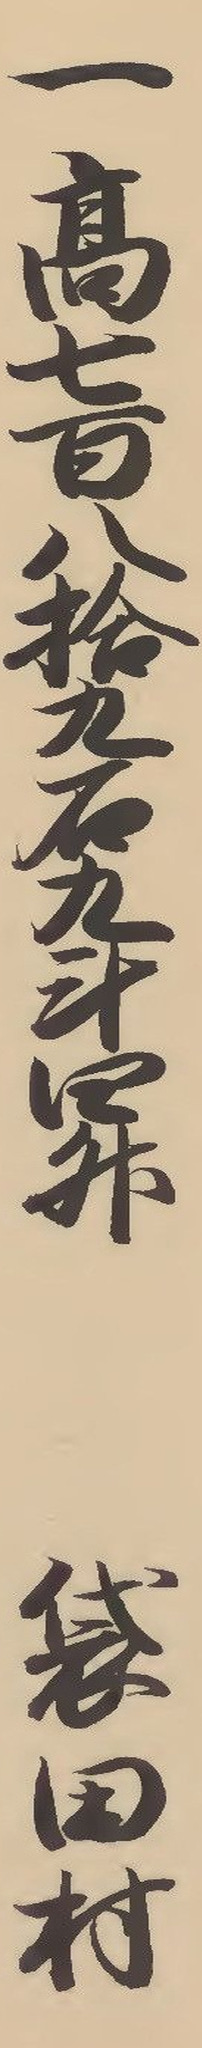一高七百八拾九石九斗四升袋田村
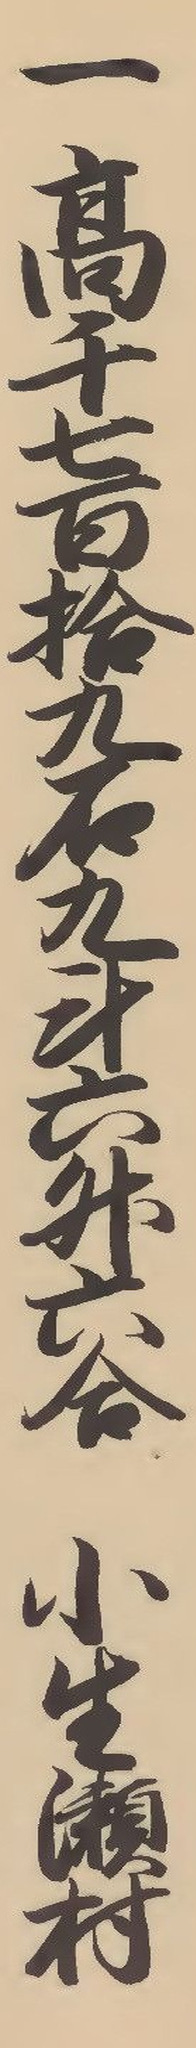一高千七百拾九石九斗六升六合小生瀬村
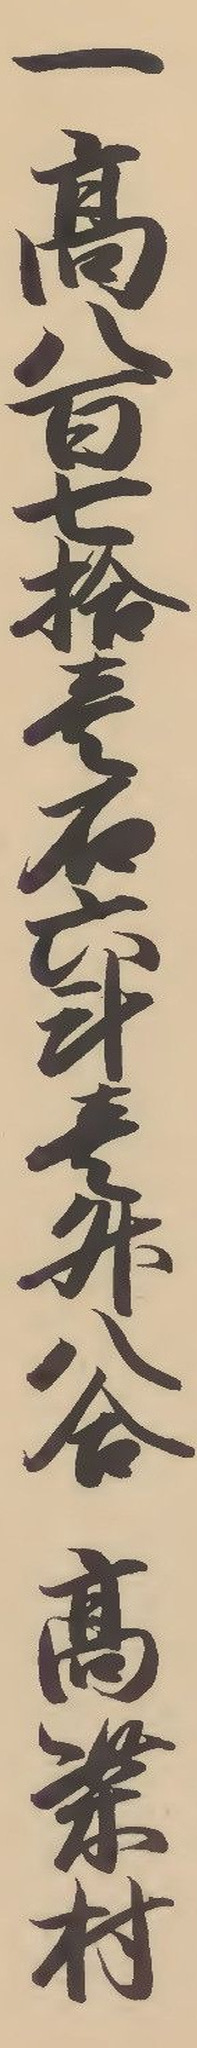一高八百七拾壱石六斗壱升八合高柴村

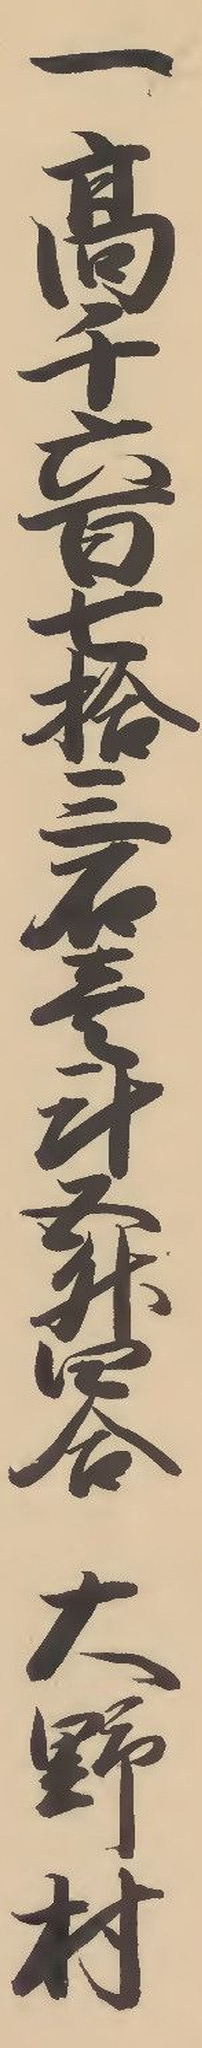一高千六百七拾三石壱斗五升四合大野村
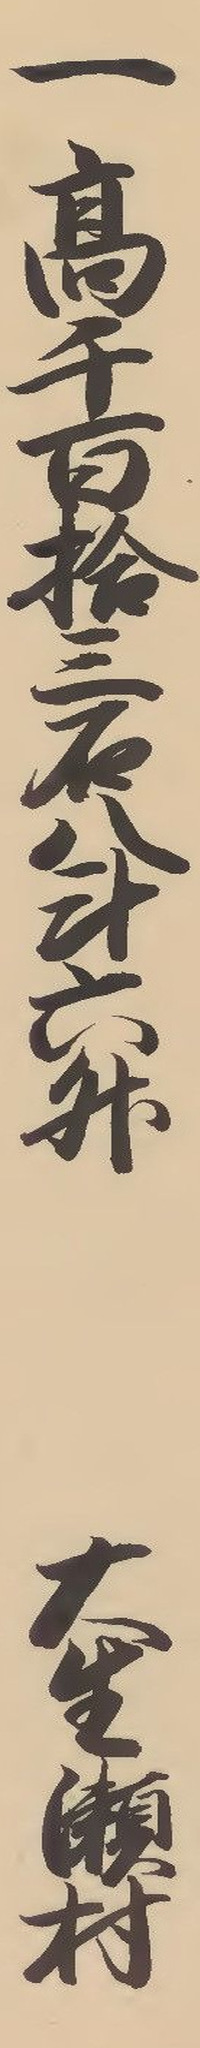一高千百拾三石八斗六升大生瀬村
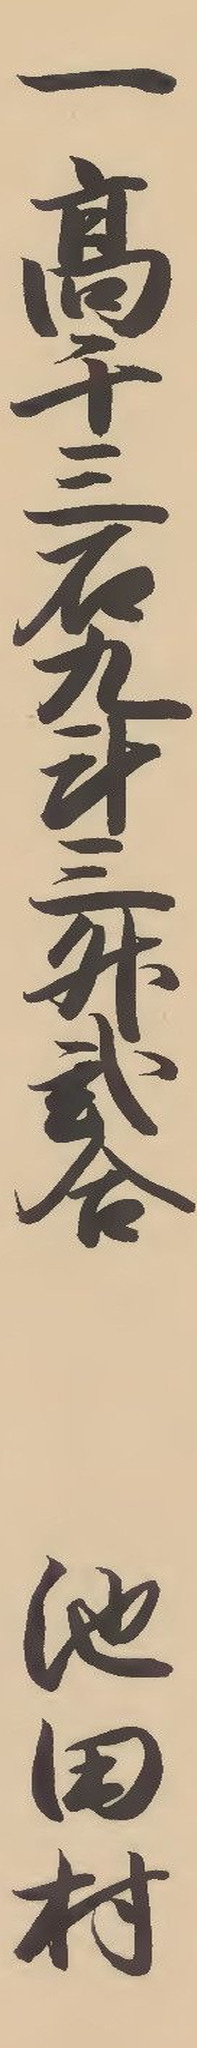一高千三石九斗三升弐合池田村
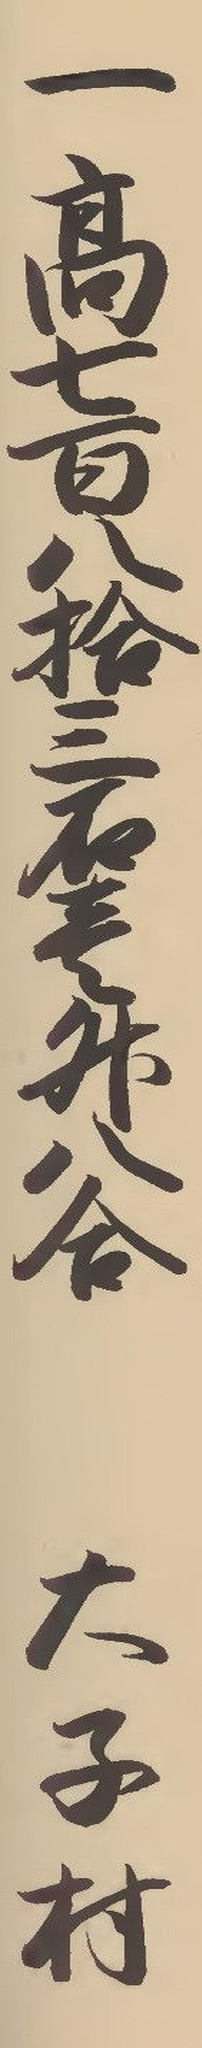一高七百八拾三石壱升八合大子村
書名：常陸国郷帳
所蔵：国立公文書館 National Archives of Japan
